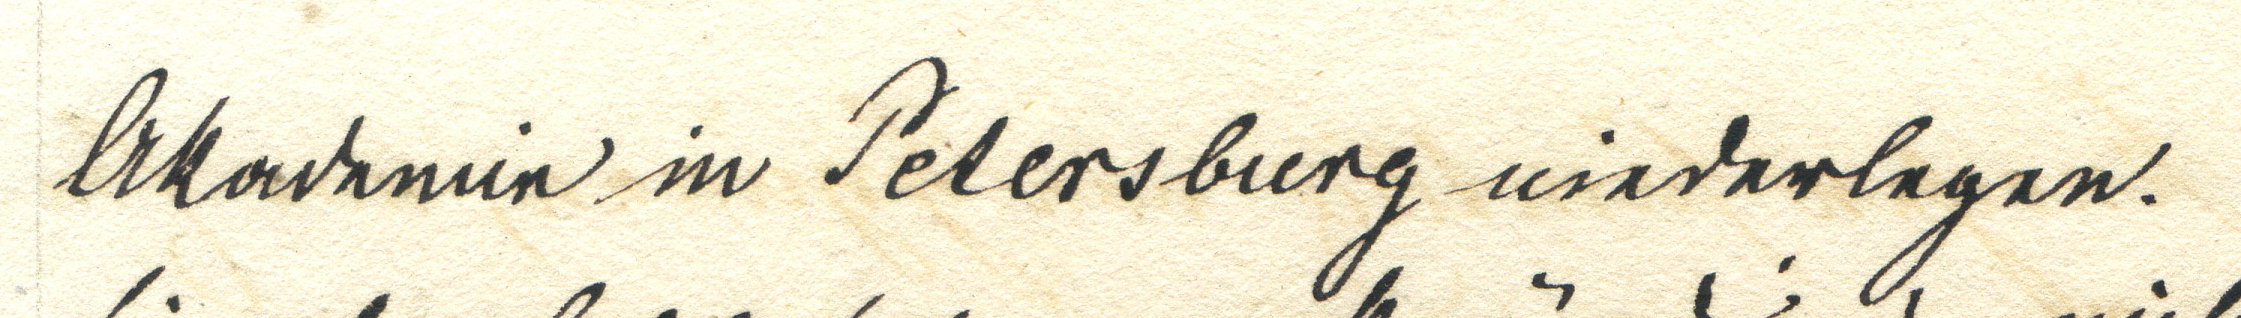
Akademie in Petersburg niederlegen.
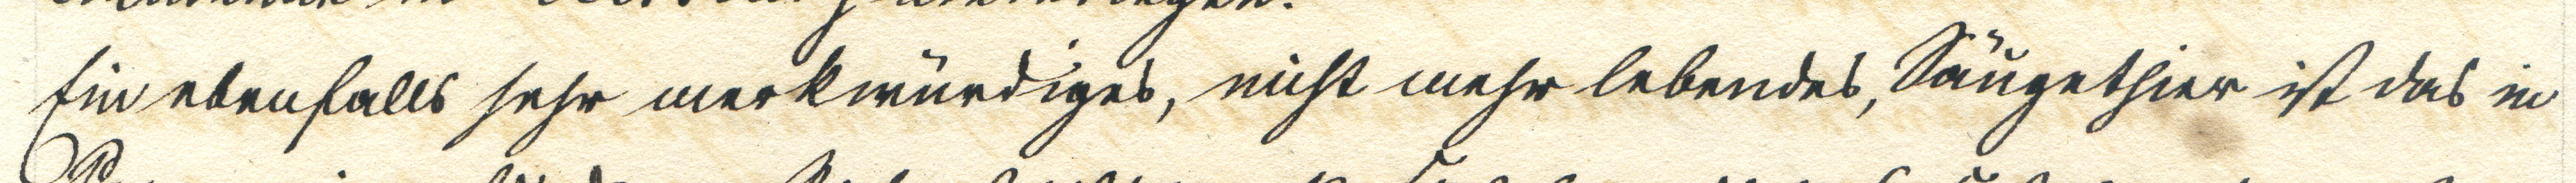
Ein ebenfalls sehr merkwürdiges, nicht mehr lebendes, Säugethier, ist das in
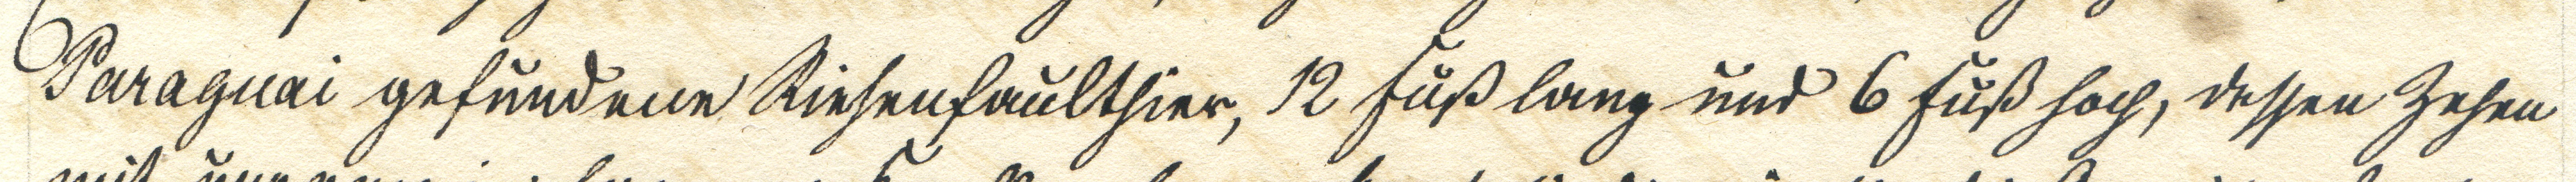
Paraguai gefundene Riesenfaulthier, 12 Fuß lang und 6 Fuß hoch, dessen Zehen
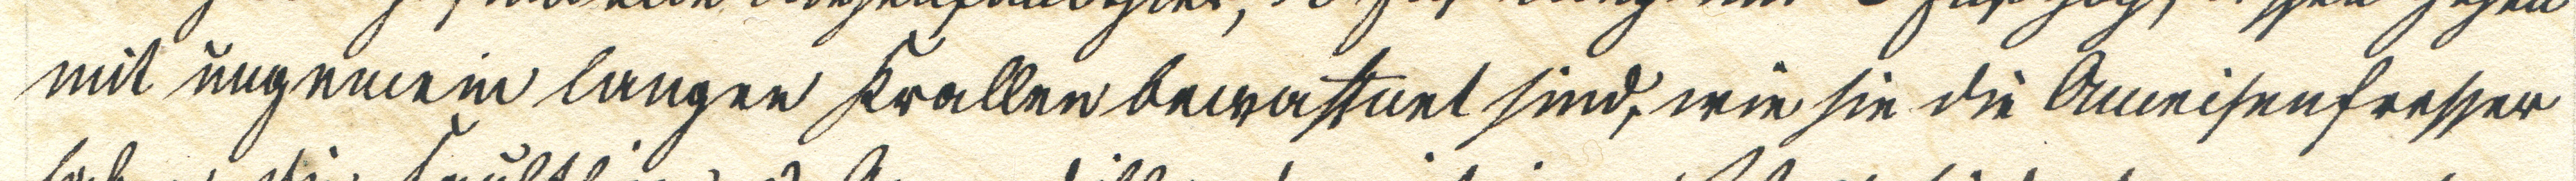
mit ungemein langen Krallen bewaffnet sind, wie sie die Ameisenfresser
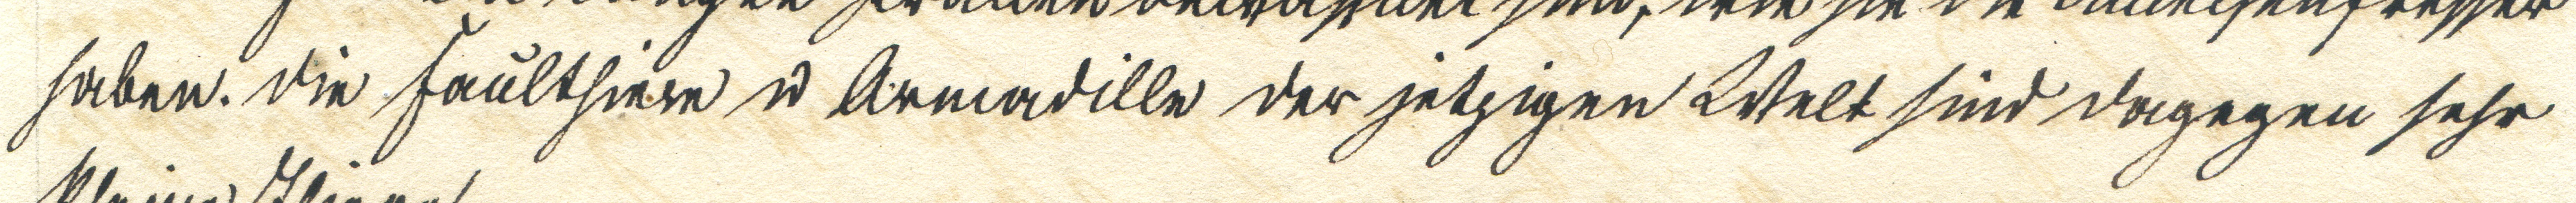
haben. Die Faulthiere u Armadille der jetzigen Welt sind dagegen sehr
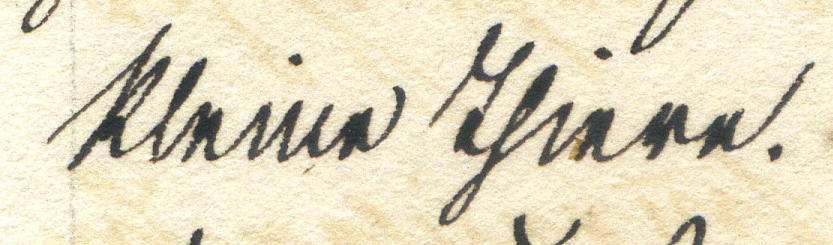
kleine Thiere.
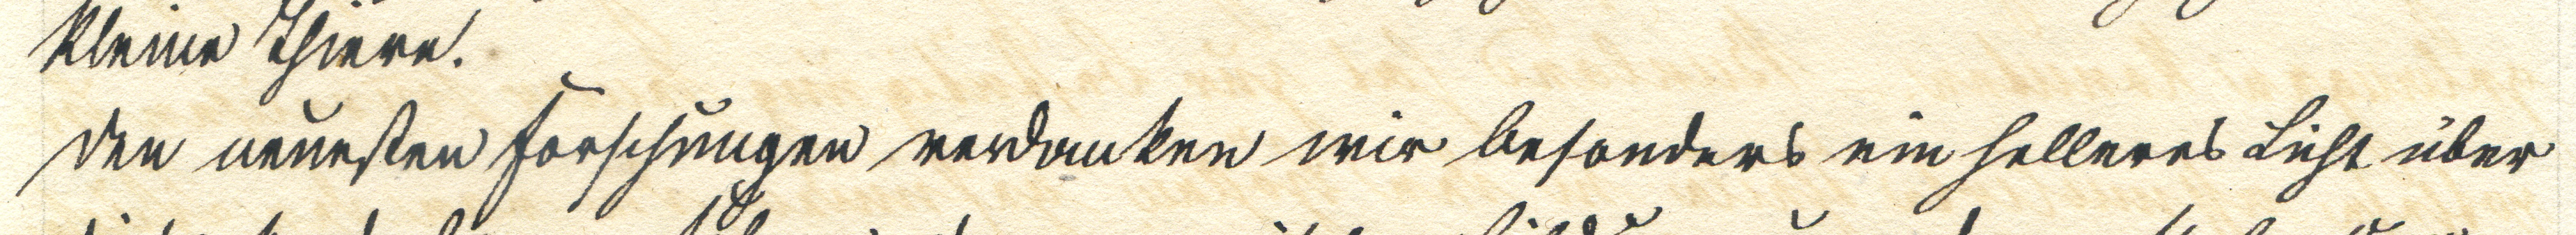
Den neuesten Forschungen verdanken wir besonders ein helleres Licht über
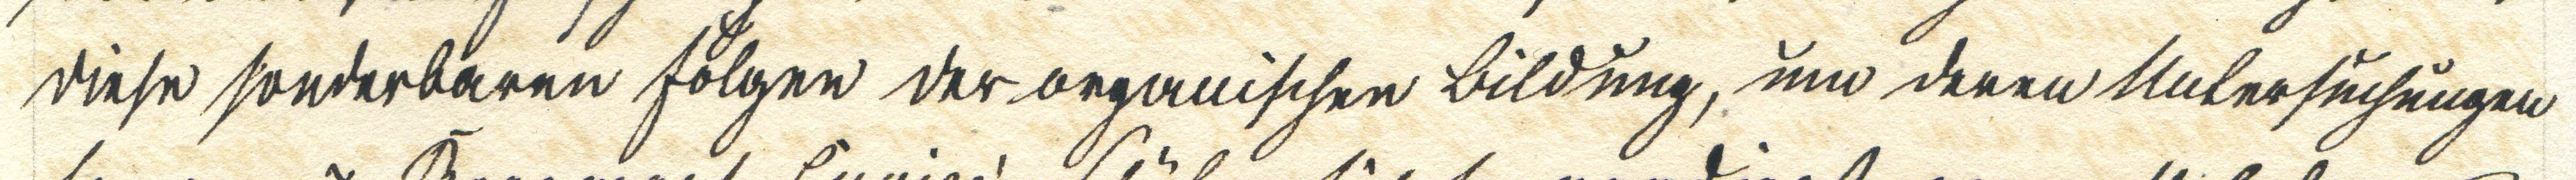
diese sonderbaren Folgen der organischen Bildungen, um deren Untersuchungen
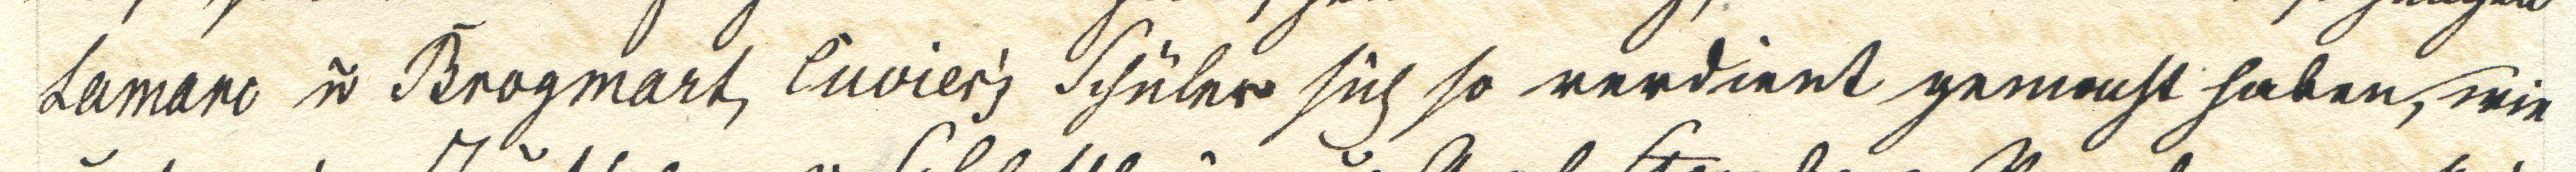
Lamarc, u Brogniart, Cuvier’s Schüler sich so verdient gemacht haben, wie
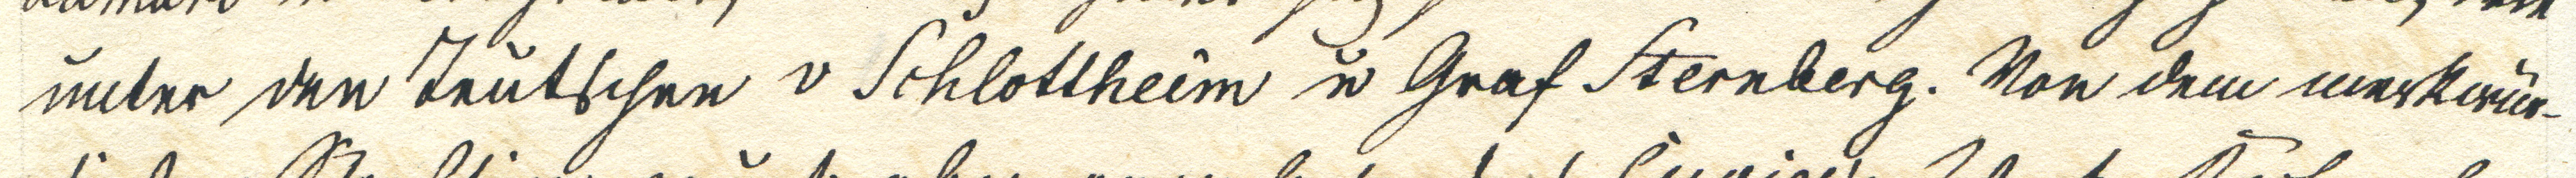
unter den Teutschen v. Schlotheim, u Graf Sternberg. Von dem merkwür-
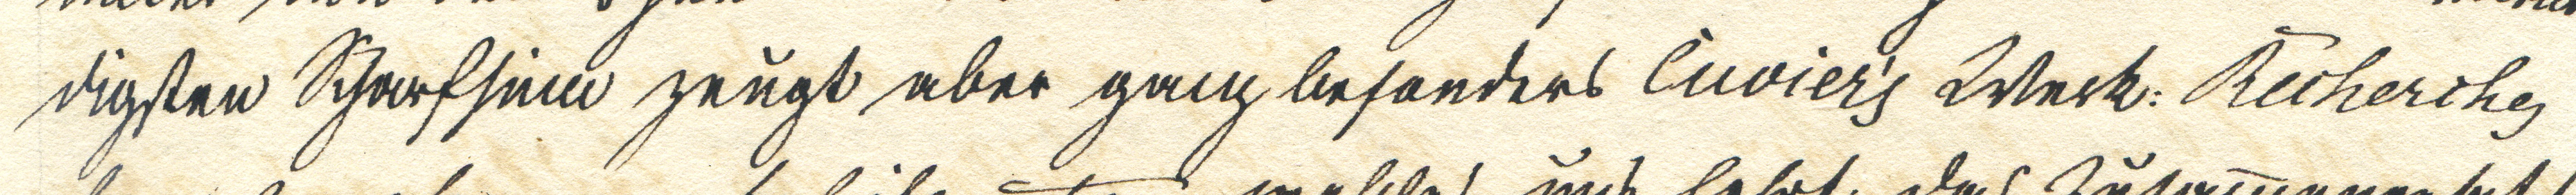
digsten Scharfsinn zeugt aber ganz besonders Cuvier’s Werk: Recherches
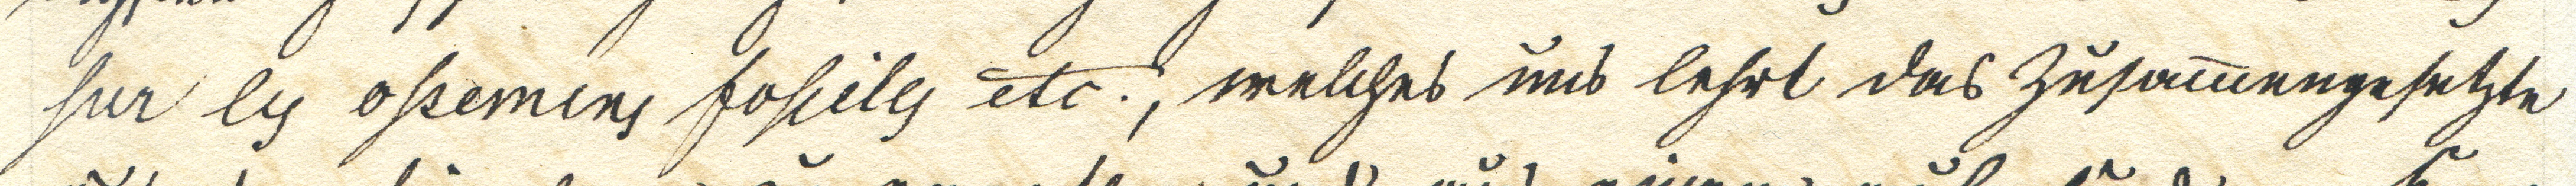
sur les ossemens fossiles etc., welches uns lehrt das Zusam̃engesetzte
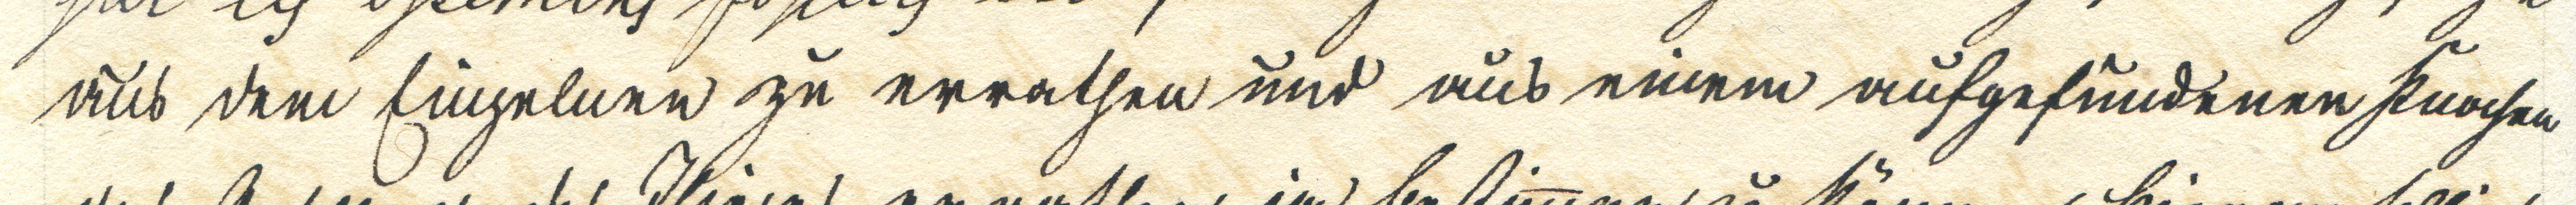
aus dem Einzelnen zu errathen und aus einem aufgefundenen Knochen
